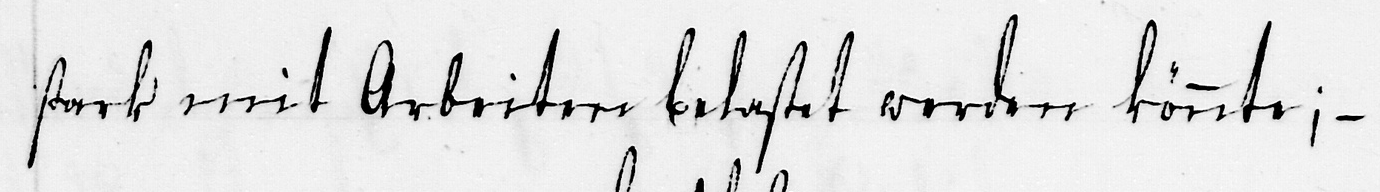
stark mit Arbeiten belastet werden könnte; –
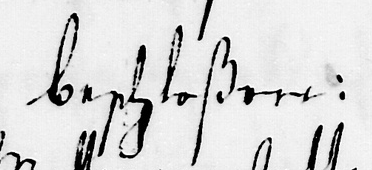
beschloßen:
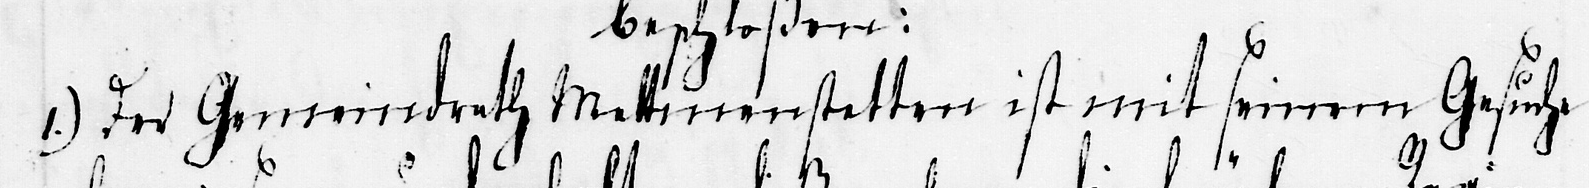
1.) Der Gemeindrath Mettmenstetten ist mit seinem Gesuche
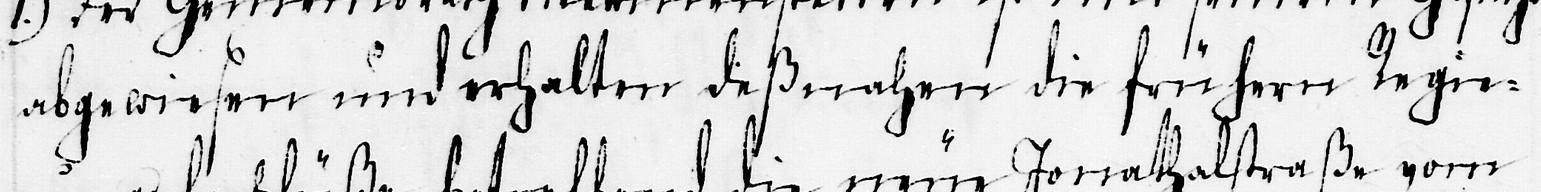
abgewiesen und erhalten deßnahen die frühern Regie¬
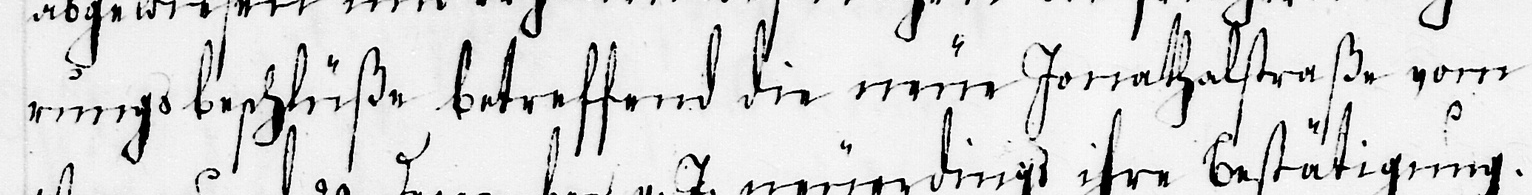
rungsbeschlüße betreffend die neue Jonathalstraße vom
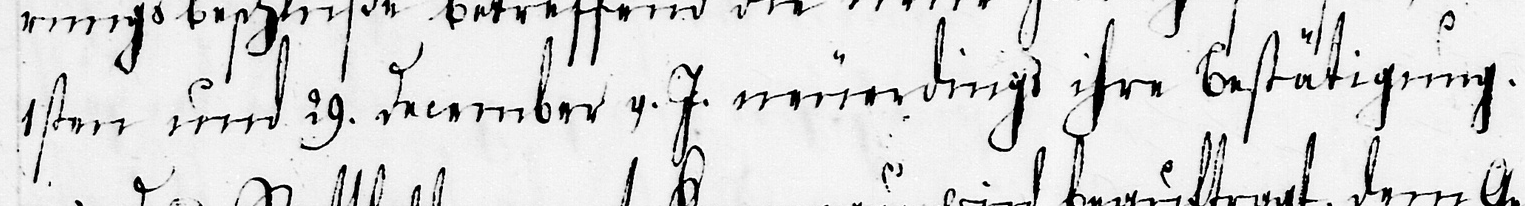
1sten und 29. December v. J. neuerdings ihre Bestätigung.
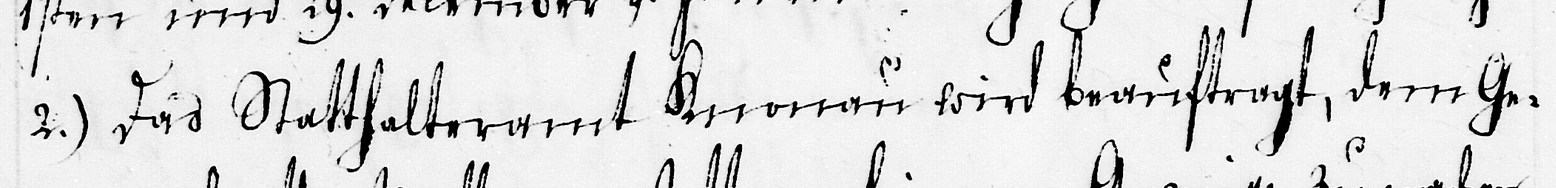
2.) Das Statthalteramt Knonau wird beauftragt, dem Ge¬
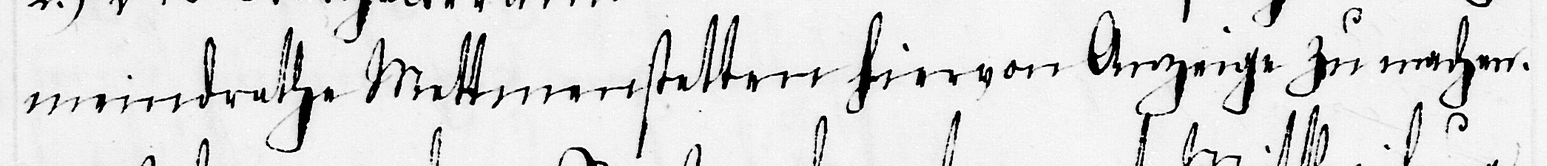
meindrathe Mettmenstetten hiervon Anzeige zu machen.
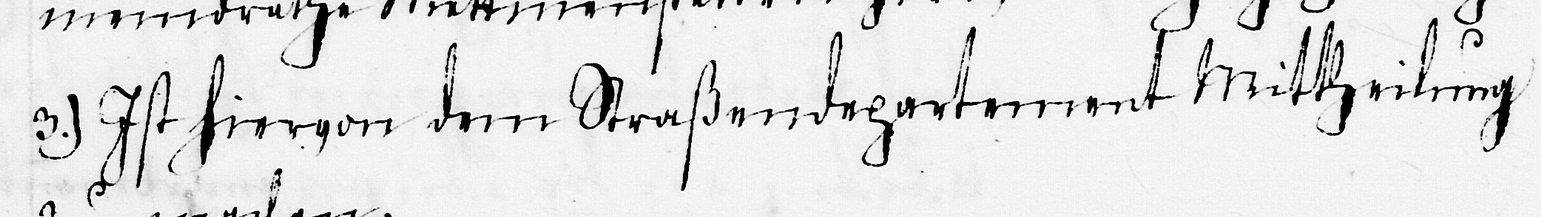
3.) Ist hiervon dem Straßendepartement Mittheilung
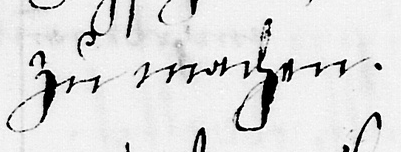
zu machen.
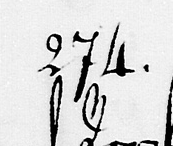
M.
